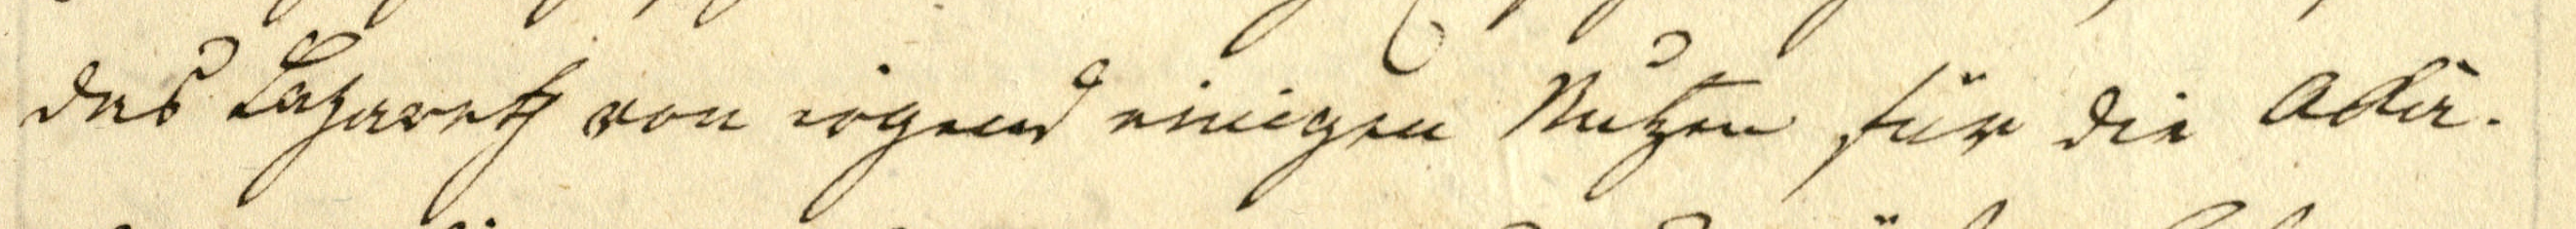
das Lazareth von irgend einigen Nutzen für die Aka¬
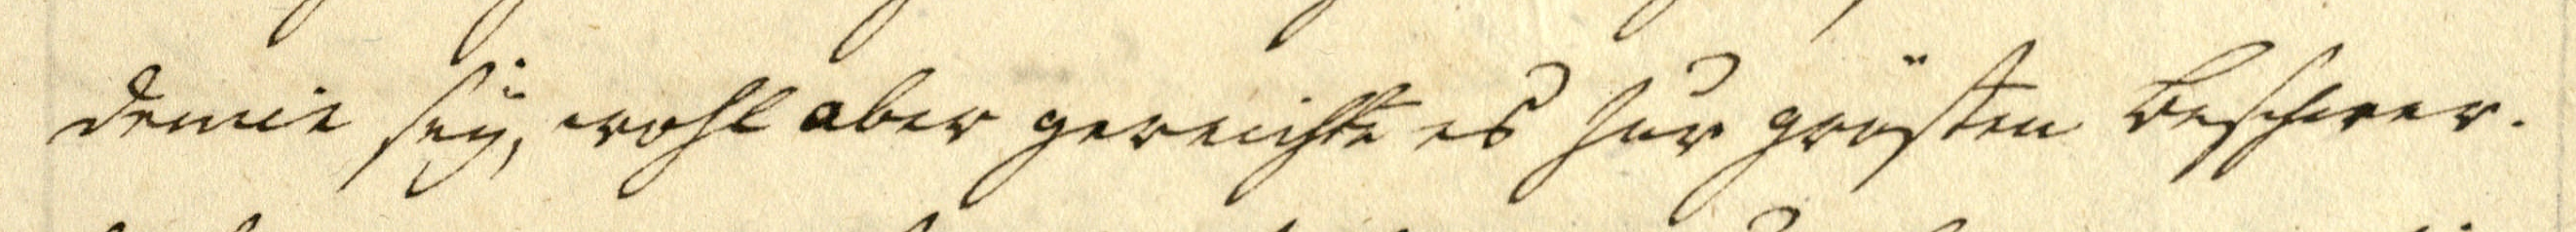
demie seÿ, wohl aber gereichte es zur grösten Beschwer¬
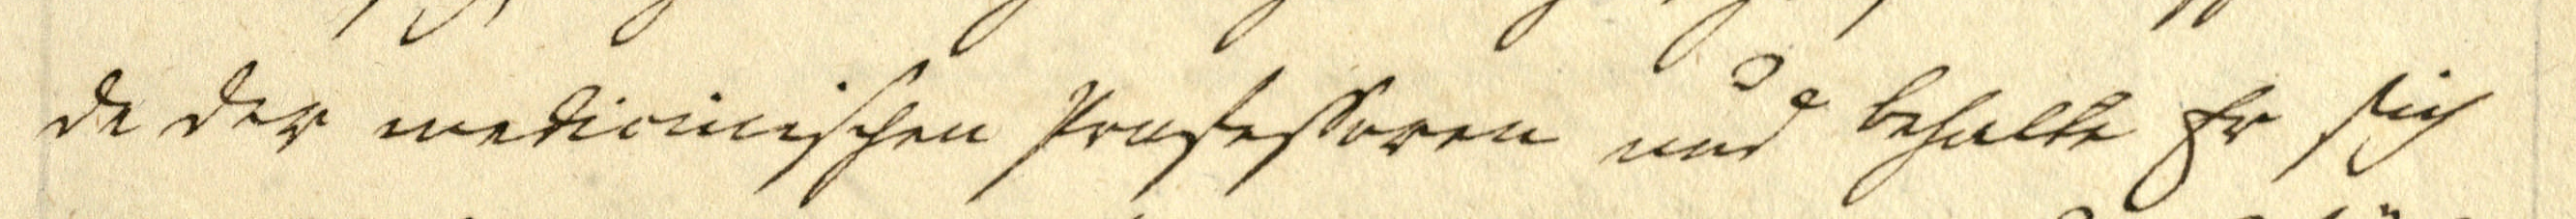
de der medicinischen Professoren und behalte Er sich
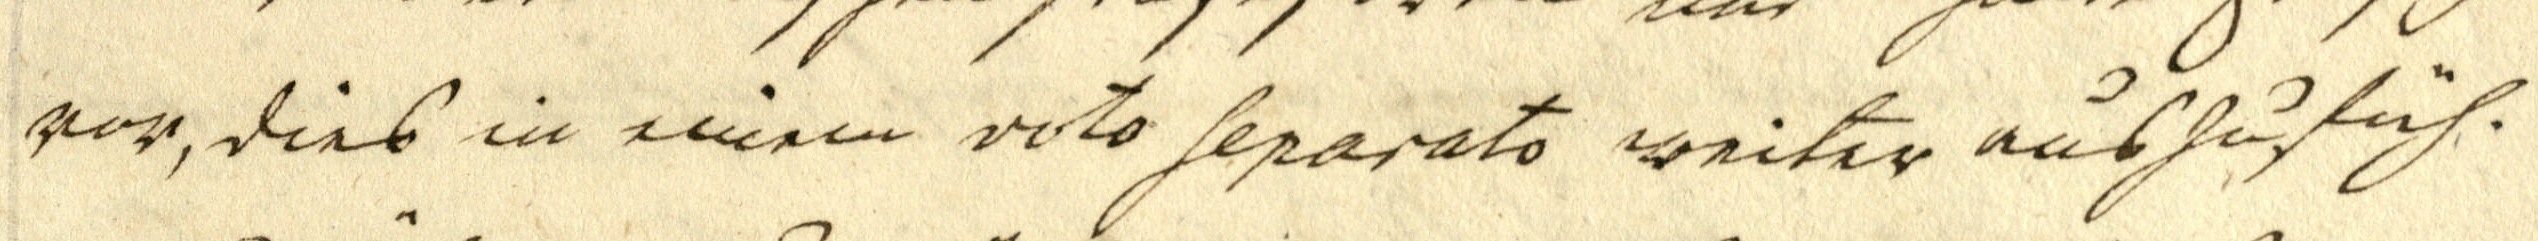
vor, dies in einem voto separato weiter auszufüh¬
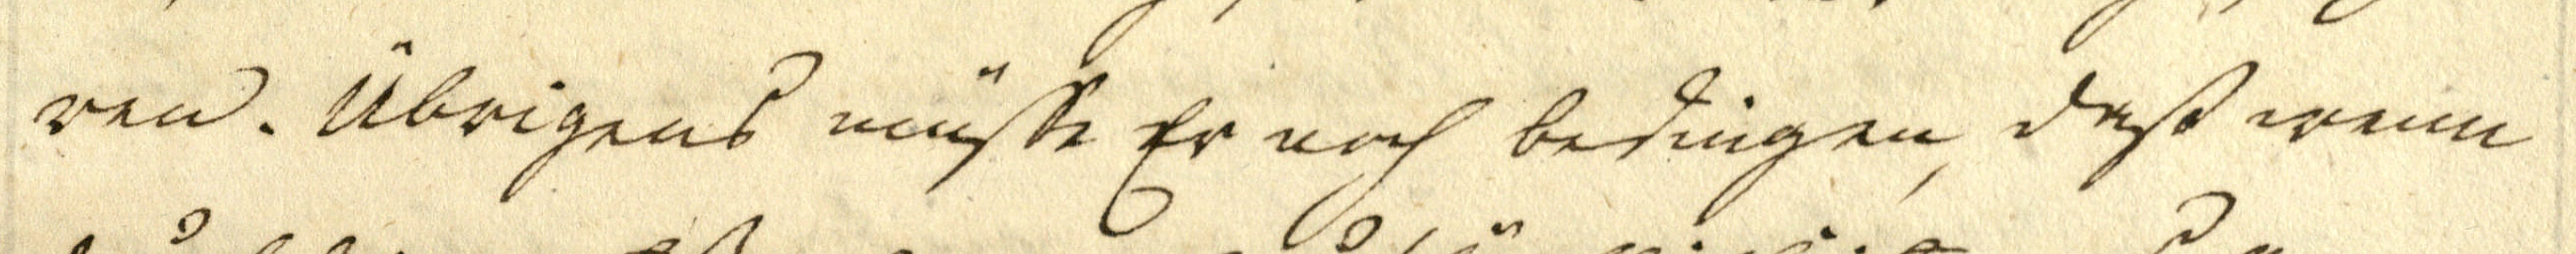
ren. Übrigens müsse Er noch bedingen, daß wenn
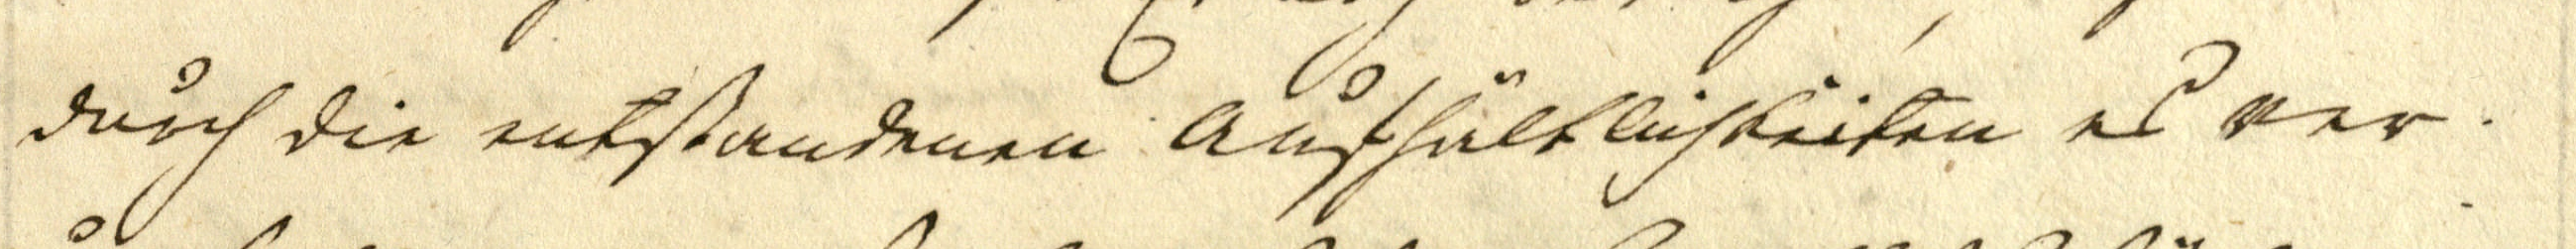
durch die entstandenen Aufhältlichkeiten es ver¬
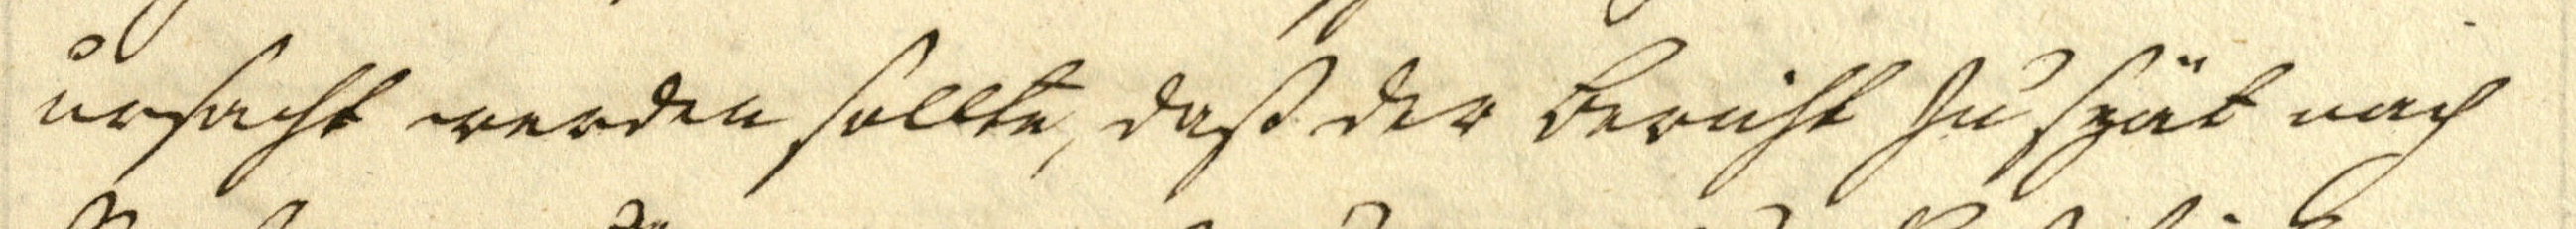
ursacht werden sollte, daß der Bericht zu spät nach
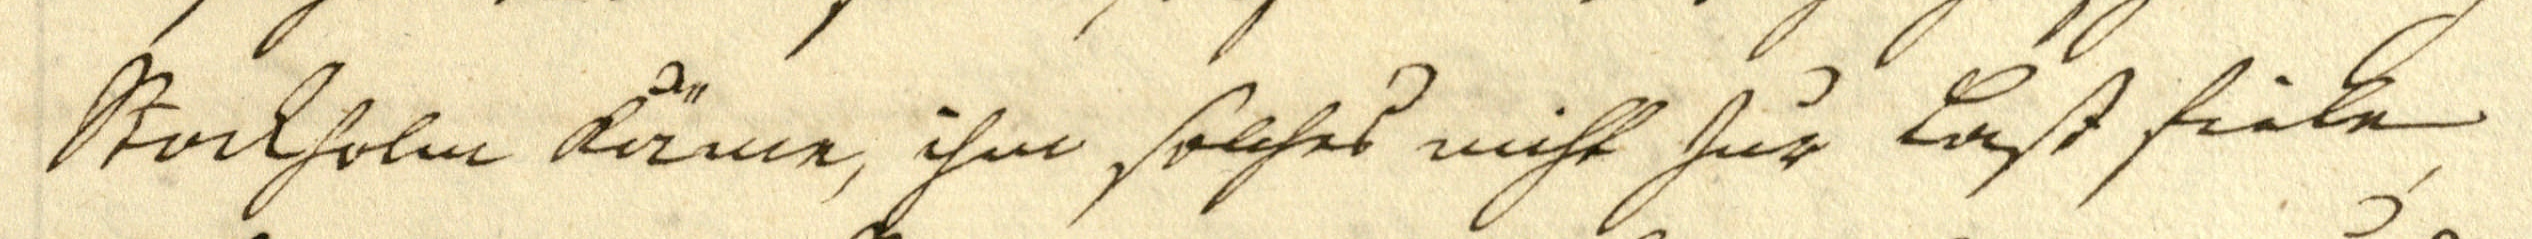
Stockholm käme, ihm solches nicht zur Last fiele
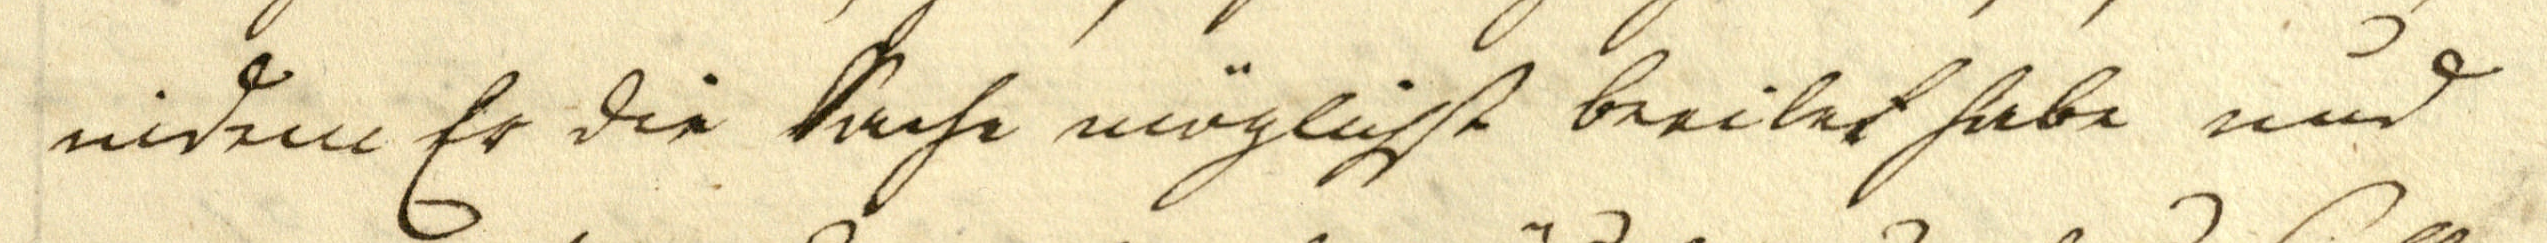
indem Er die Sache möglichst beeilet habe und
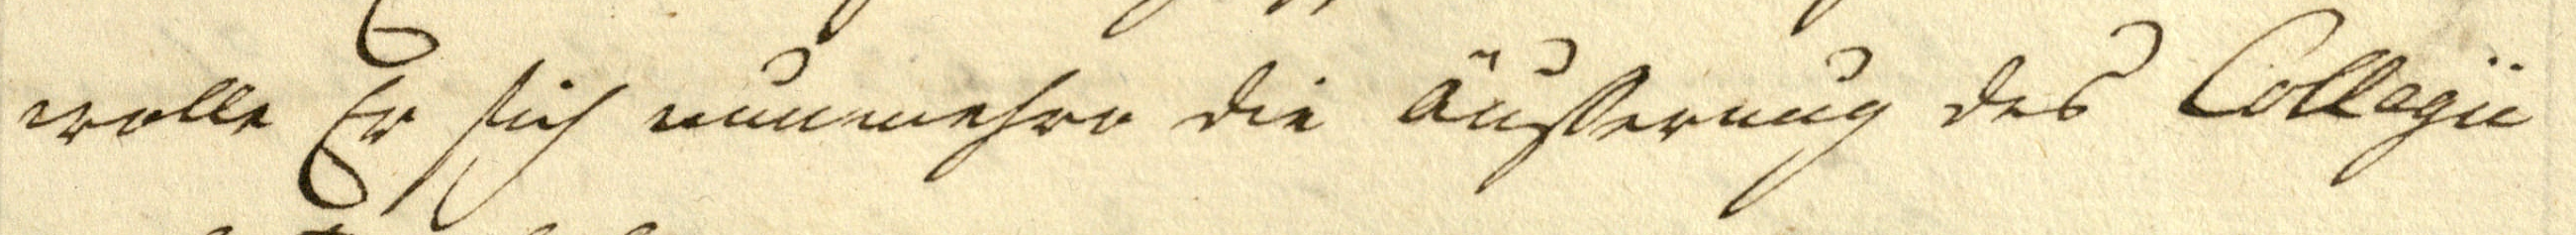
wolle Er sich nunmehro die Äusserung des Collegii
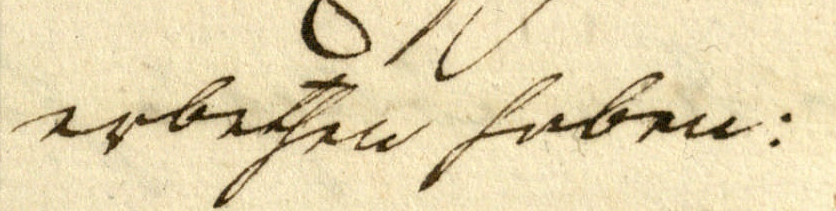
erbethen haben:
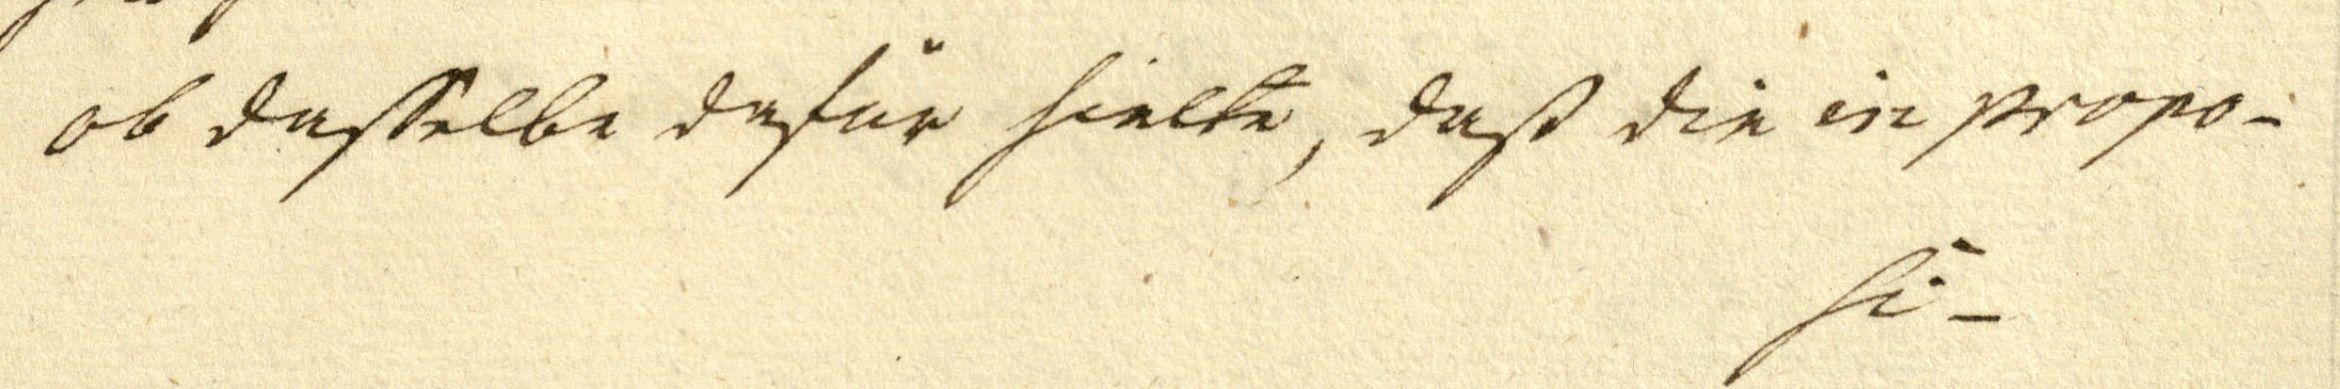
ob dasselbe dafür hielte, daß die in propo¬
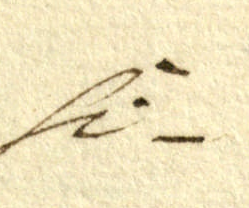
si
